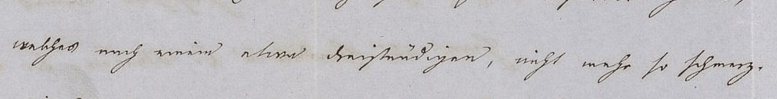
welches nach einem etwa dreistündigen, nicht mehr so schmerz-
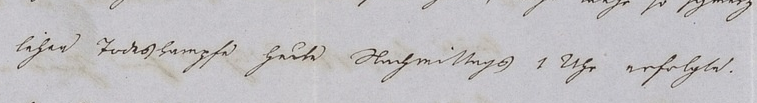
lichen Todeskampfe heute Nachmittags 1 Uhr erfolgte.
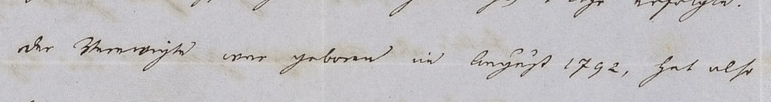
Der Verewigte war geboren im August 1792, hat also
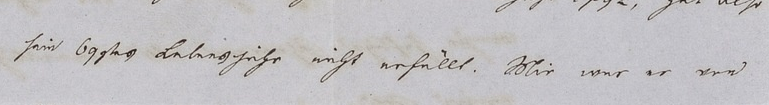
sein 69tes Lebensjahr nicht erfüllt. Mir war er von
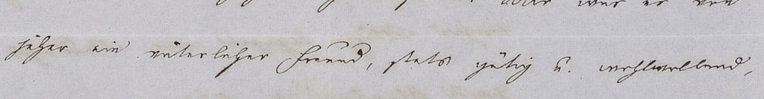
jeher ein väterlicher Freund, stets gütig u. wohlwollend,
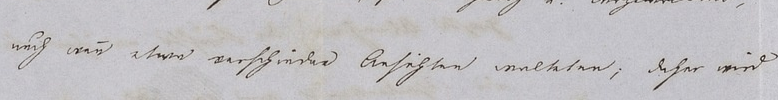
auch wenn etwa verschiedne Ansichten walteten; daher wird
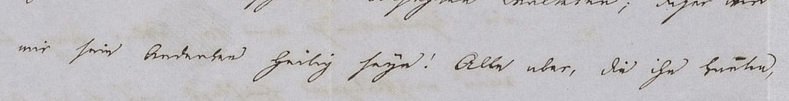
mir sein Andenken heilig seyn! Alle aber, die ihn kannten,
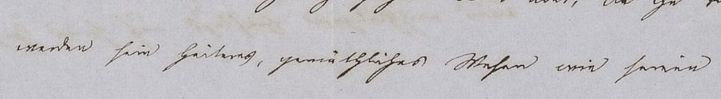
werden sein heiteres, gemüthliches Wesen wie seinen
